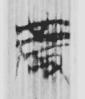皮
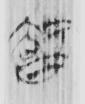智
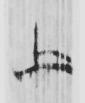上
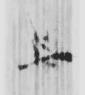之
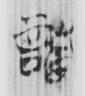請
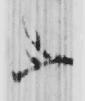之
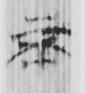不
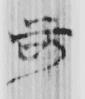可
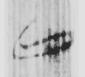㠯（以）
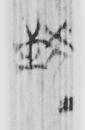幸
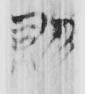則
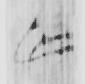亡
